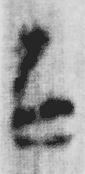㠯（以）
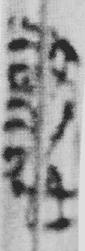○（猷）
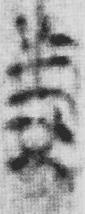者
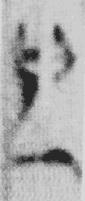也
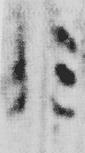門
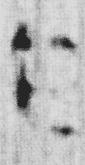内
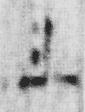之
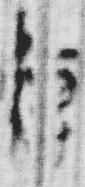紿（治）
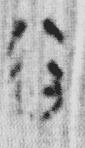谷（欲）
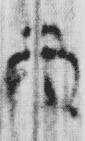亓（其）
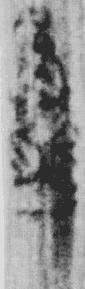○（宛）
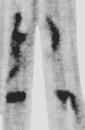也
